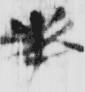未
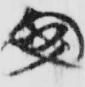安
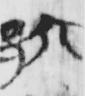陸
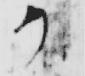人
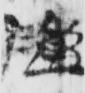○（陳）
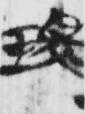環
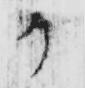人
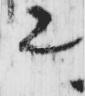乙
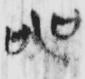申
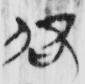卲
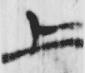上
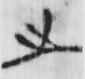之
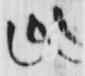州
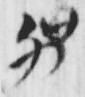加
